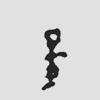昜
